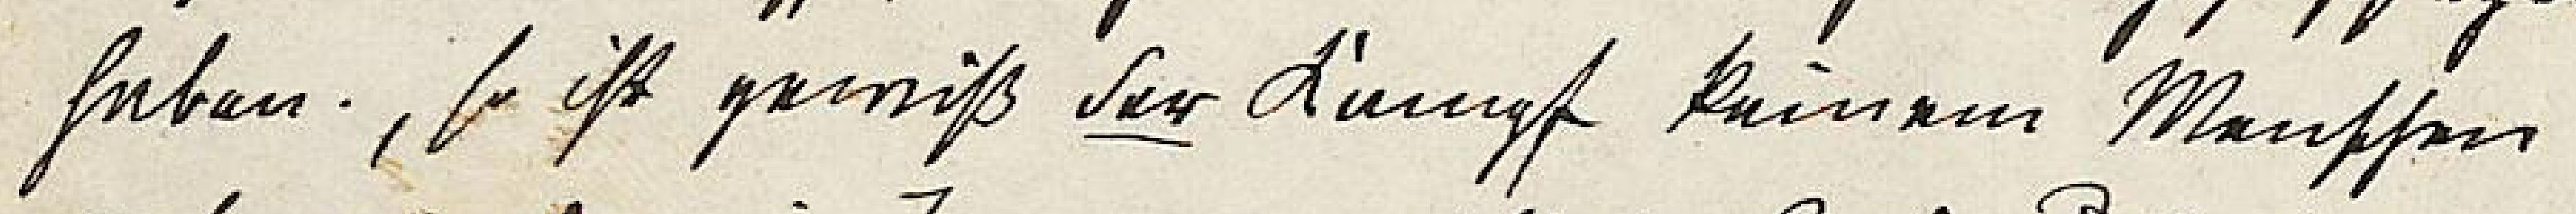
haben, so ist gewiß der Kampf keinem Menschen
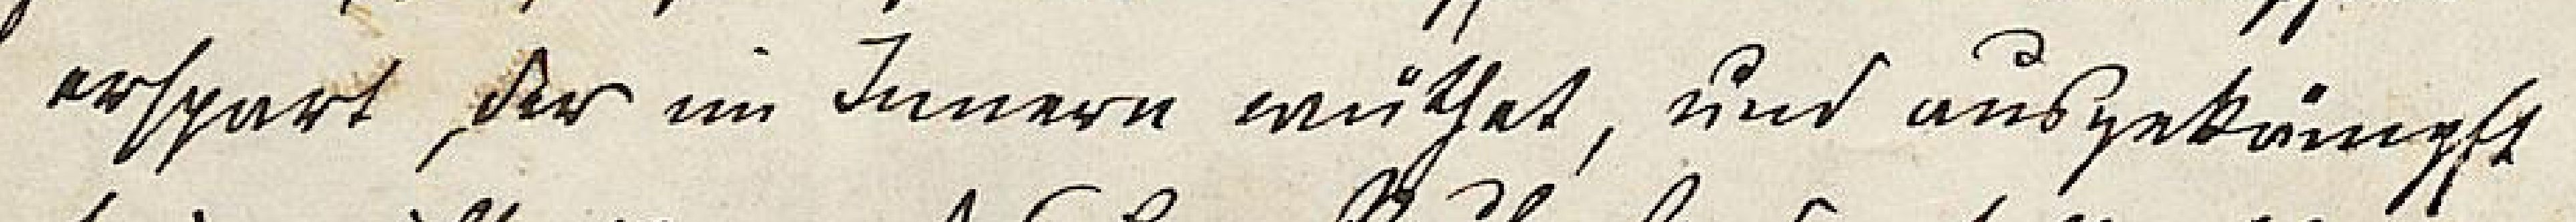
erspart, der im Innern wüthet, und ausgekämpft
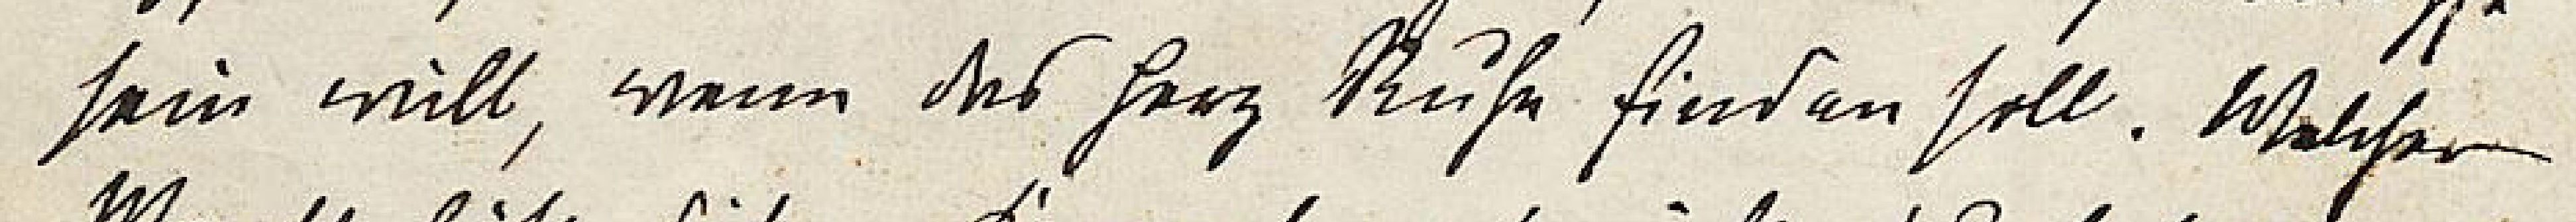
sein will, wenn das Ruhe finden soll. Welcher
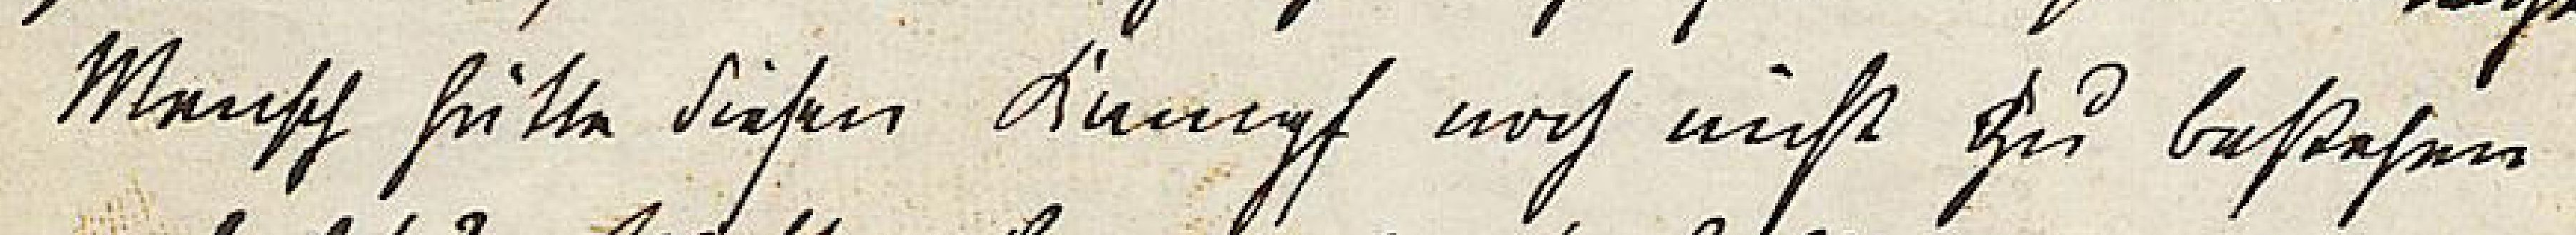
Mensch hätte diesen Kampf noch nicht zu bestehen
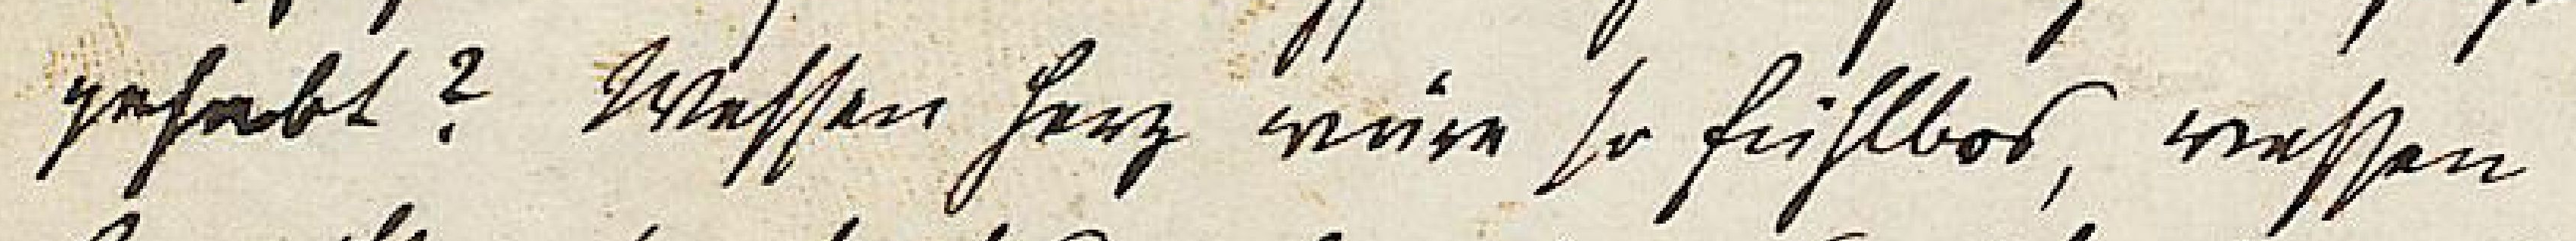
gehabt? Wessen Herz wäre so fühllos, wessen
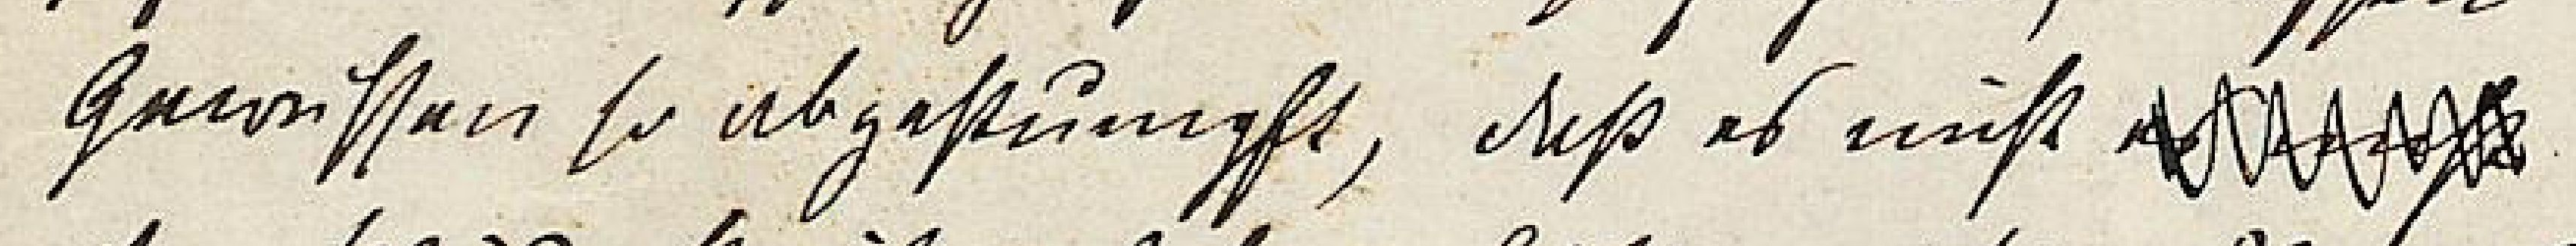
Gewissen so abgestumpft, daß es nicht es macht
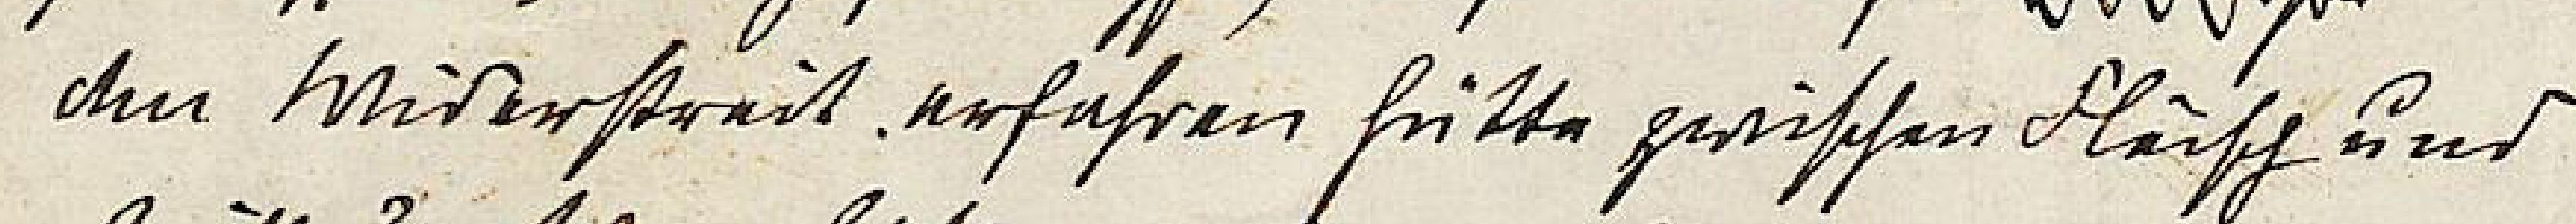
dem Widerstreit erfahren hätte zwischen Fleisch und
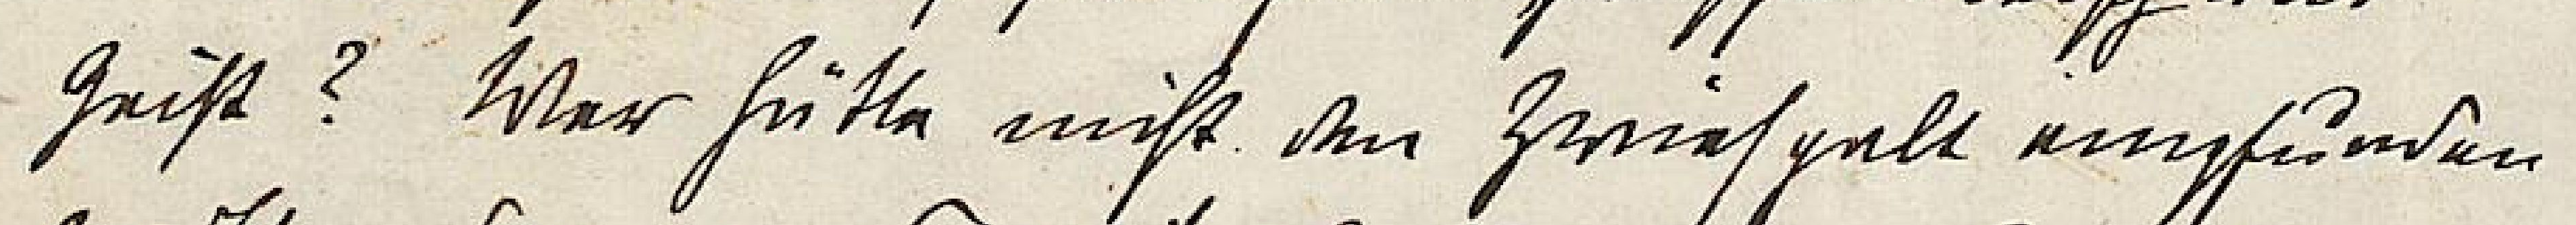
Geist? Wer hätte nicht den Zwiespalt empfunden
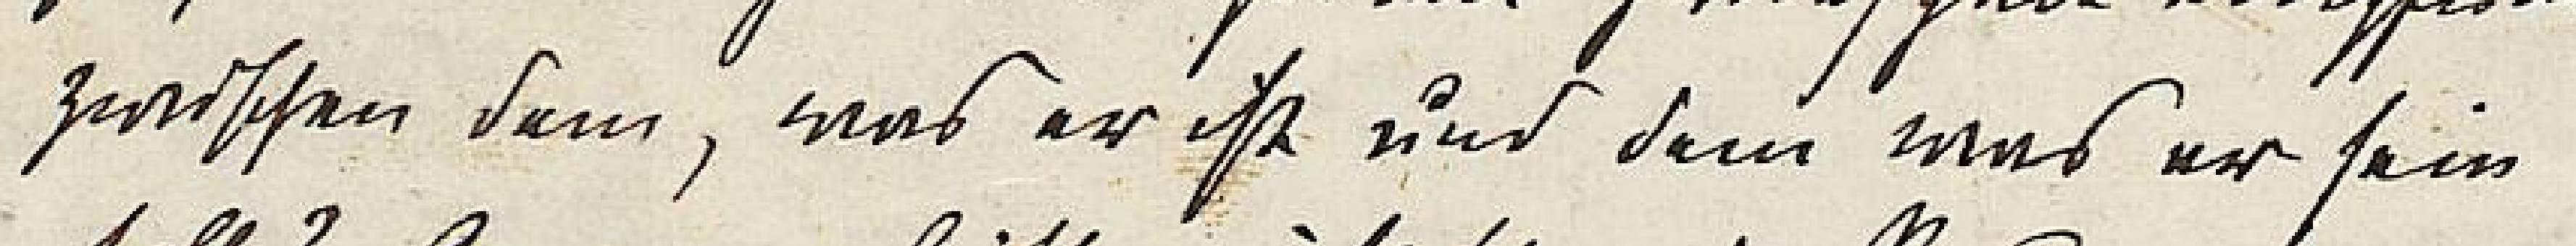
zwischen dem, was er ist und dem was er sein
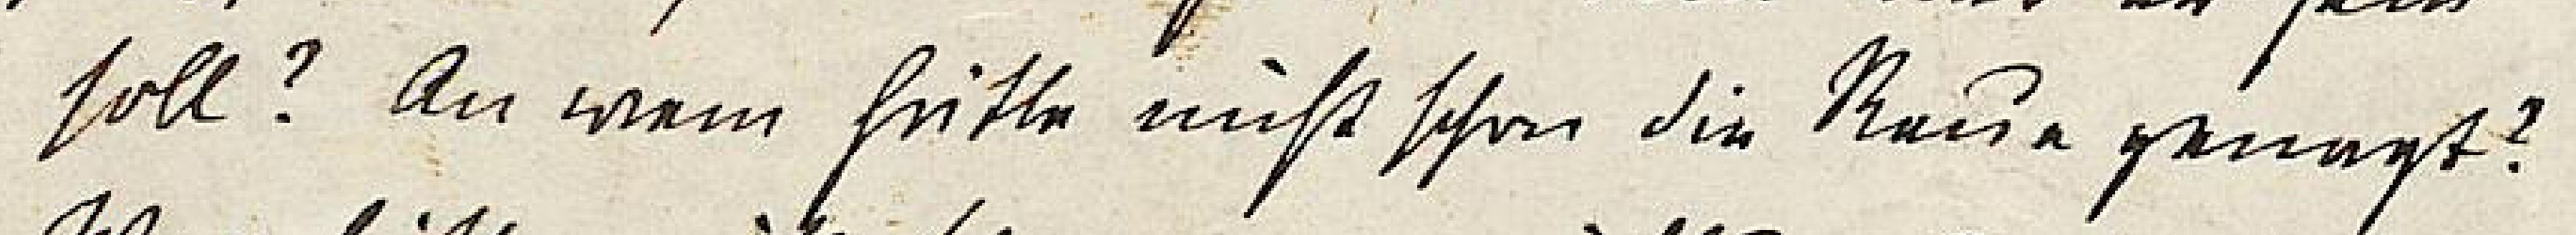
soll? An wem hätte nicht schon die Reue genagt?
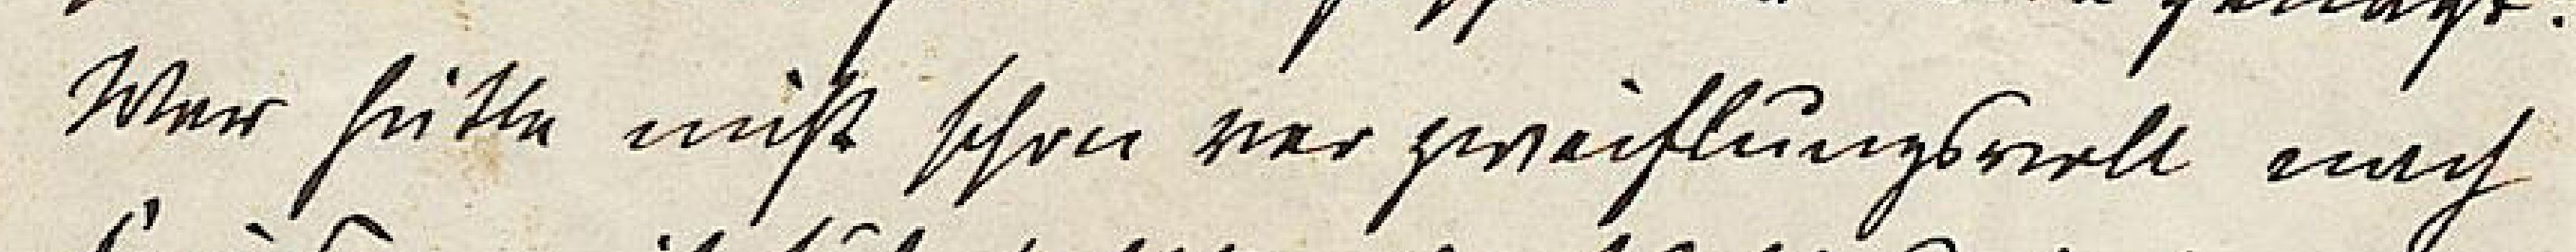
Wer hätte nicht schon verzweiflungsvoll nach
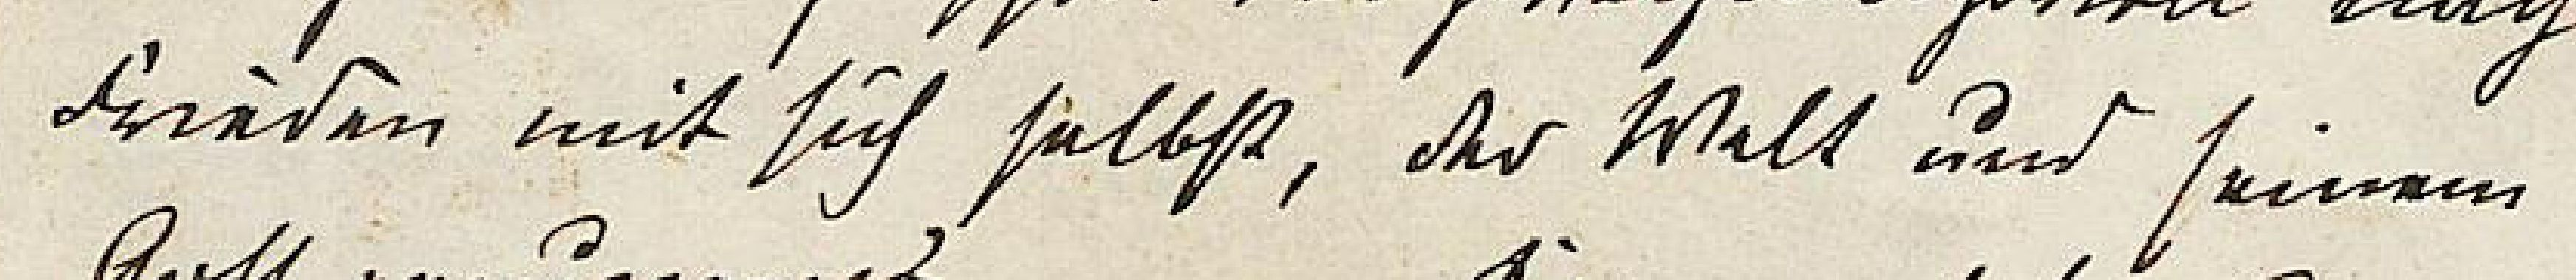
Frieden mit sich selbst, der Welt und seinem
